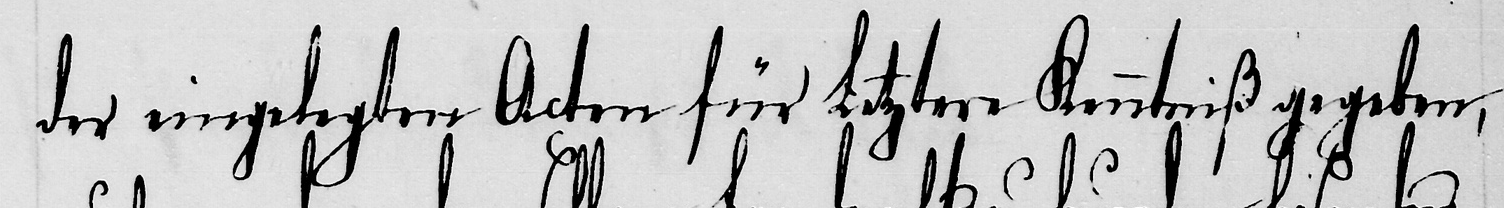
der eingelegten Acten für Letztere Kenntniß gegeben,
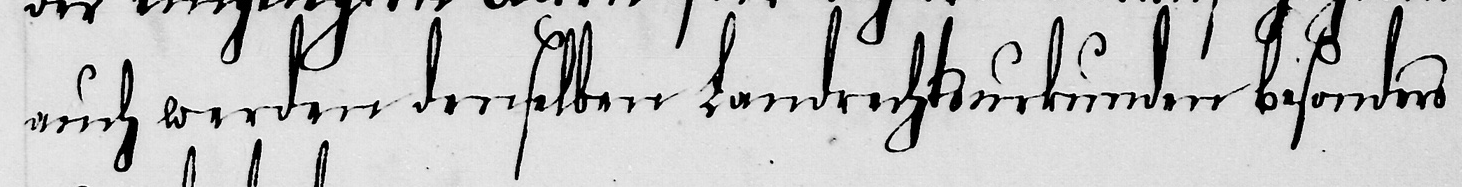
auch werden denselben Landrechtsurkunden besonders
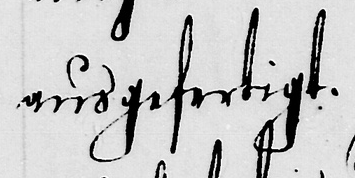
ausgefertig¬
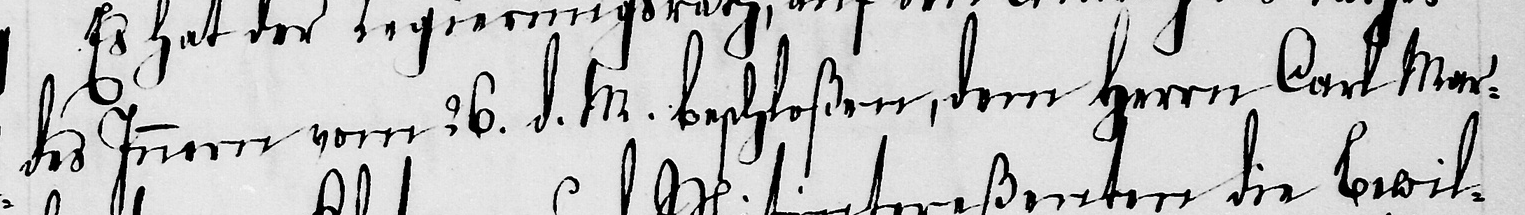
des Innern vom 26. d. M. beschloßen, dem Herrn Carl Mar¬
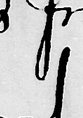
3.
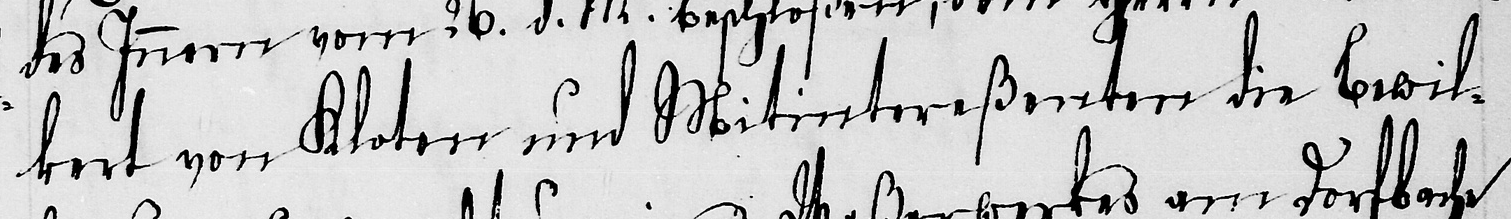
kert von Kloten und Mitintereßenten die Bewil¬
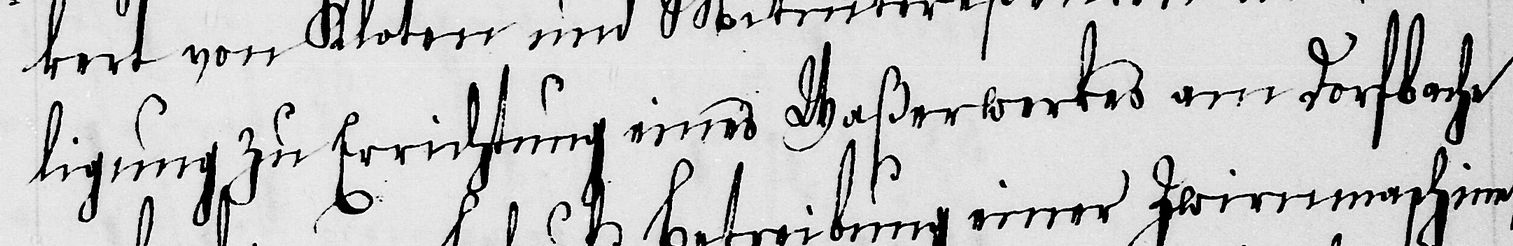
ligung zu Errichtung eines Waßerwerkes am Dorfbache
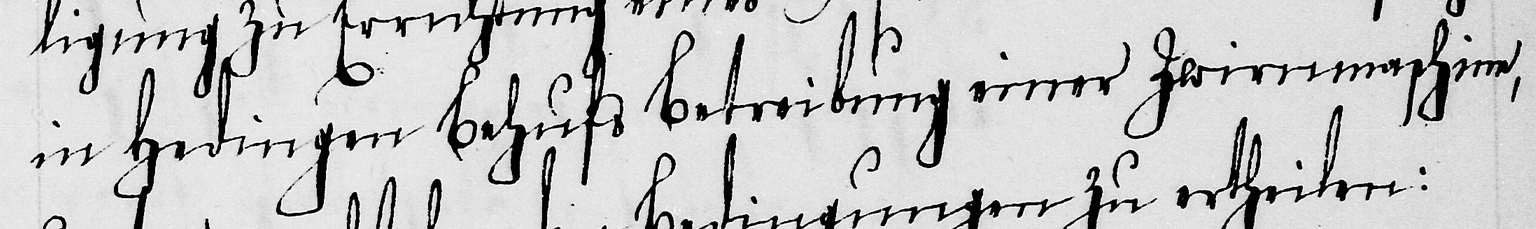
in Hedingen Behufs Betreibung einer Zwirnmaschine,
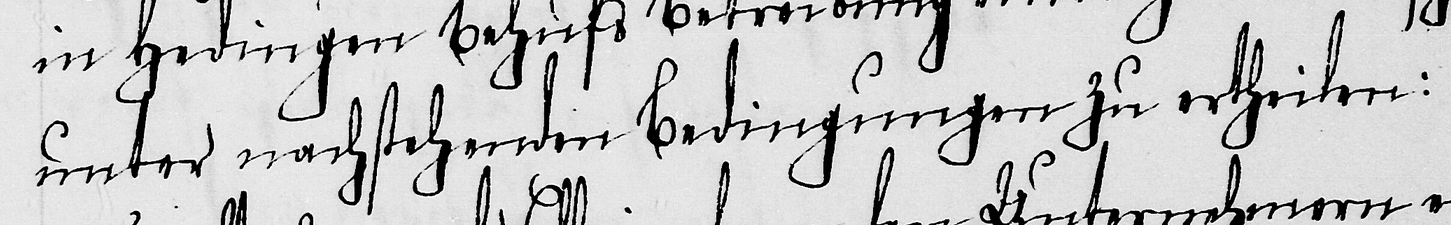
unter nachstehenden Bedingungen ertheilen:
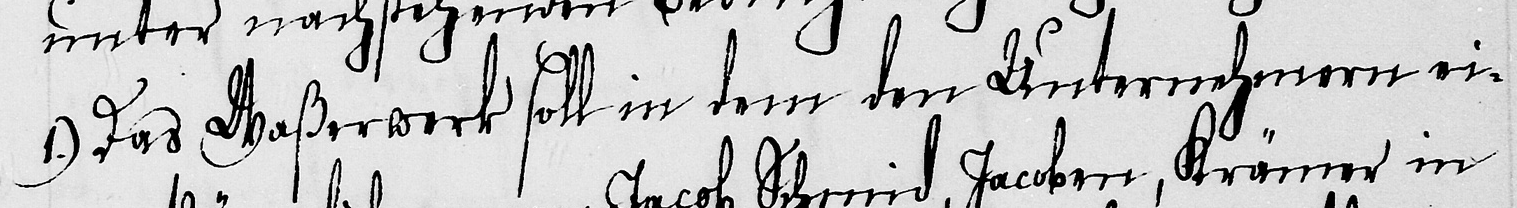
1.) Das Waßerwerk soll in dem den Unternehmern ei¬
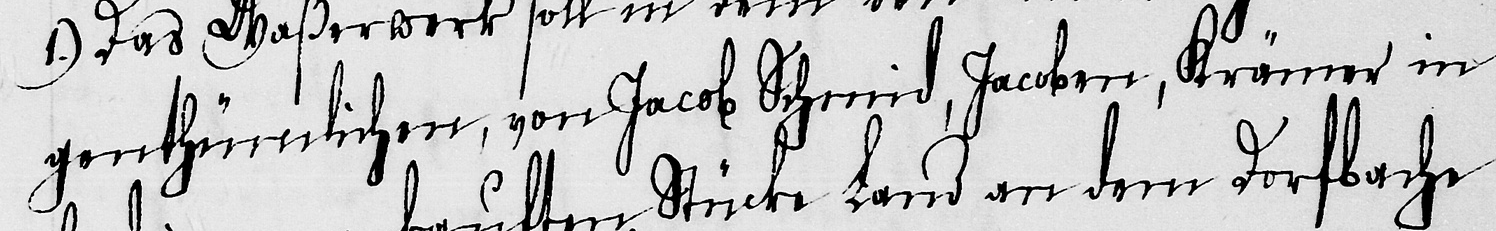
genthümlichen, von Jacob Schmid, Jacoben, Krämer in
